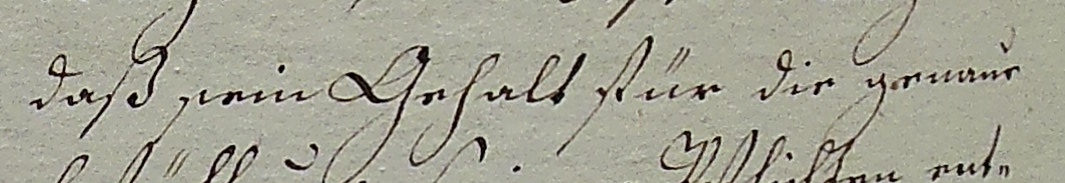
daß sein Gehalt für die genaue
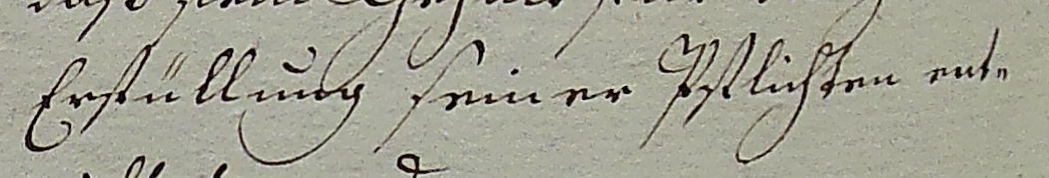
Erfüllung seiner Pflichten ent¬
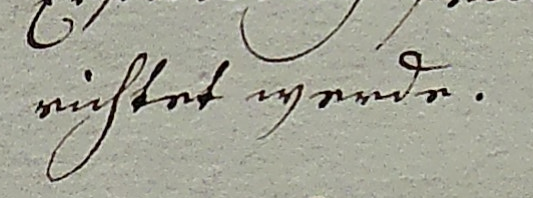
richtet werde.
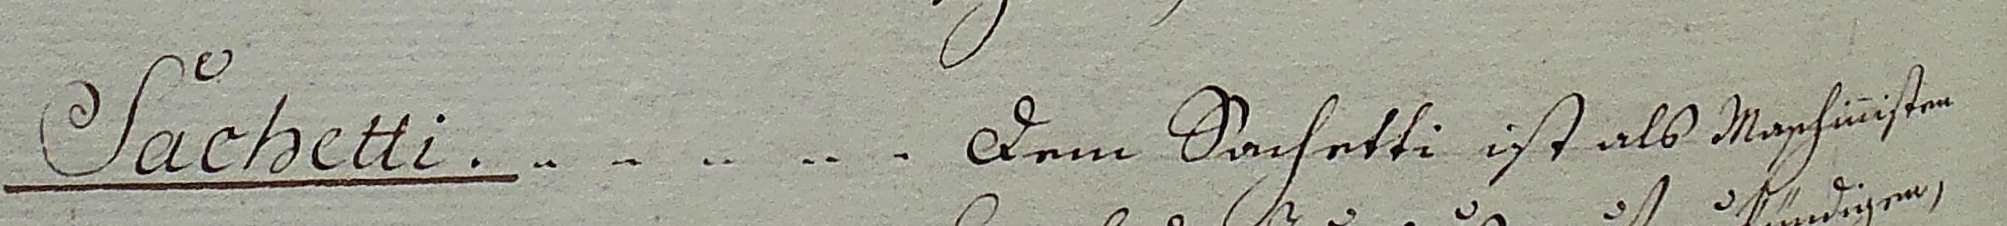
Sachetti. .. .. .. .. .. Dem Sachetti ist als Maschin̅isten
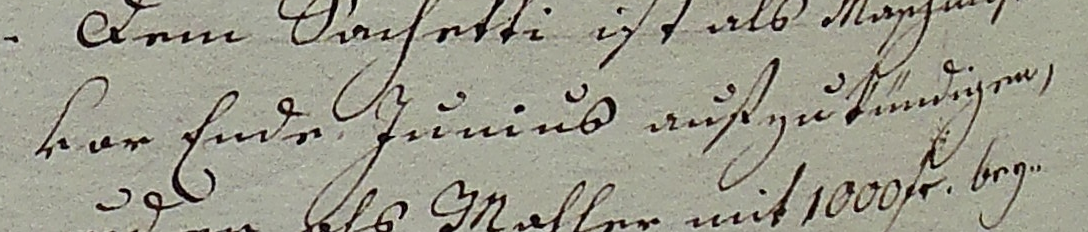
vor Ende Junius aufzukündigen,
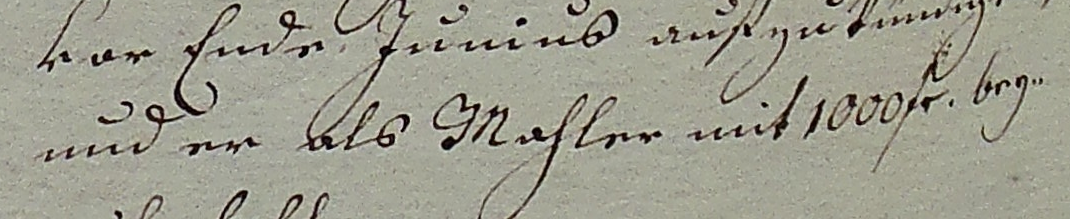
und er als Mahler mit 1000fr. bey¬
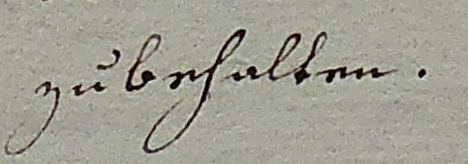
zubehalten.
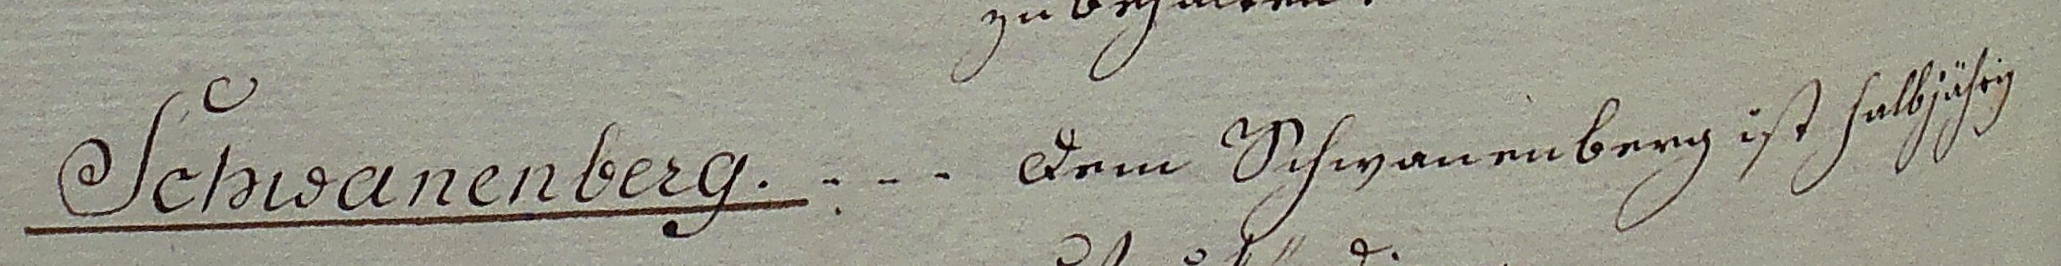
Schwanenberg. .. .. .. Dem Schwanenberg ist halbjährig
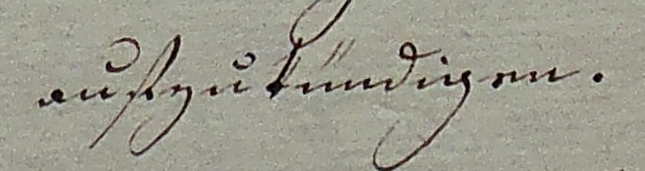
aufzukündigen.
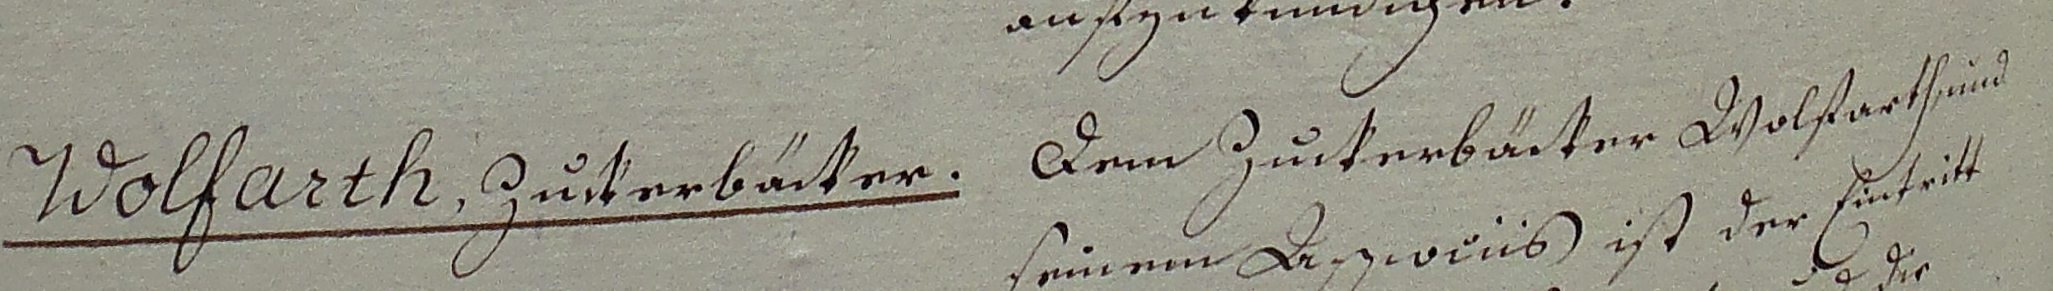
Wolfarth, Zuckerbäcker. Dem Zuckerbäcker Wolfarth und
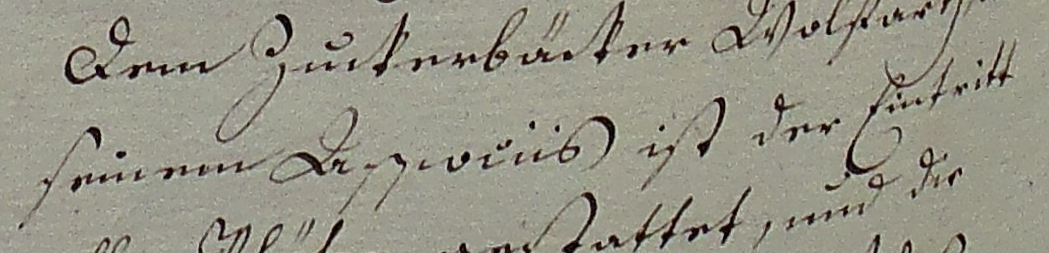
seinem Associis ist der Eintritt
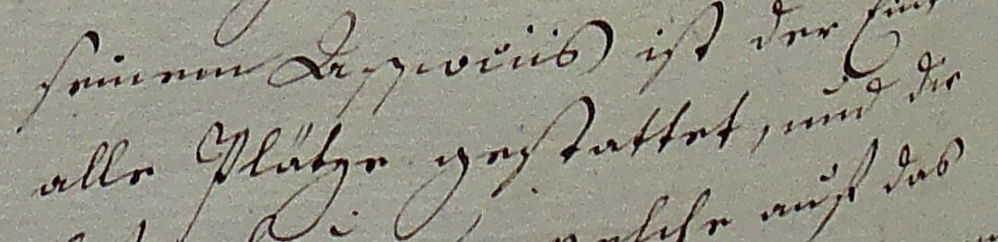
alle Plätze gestattet, und die
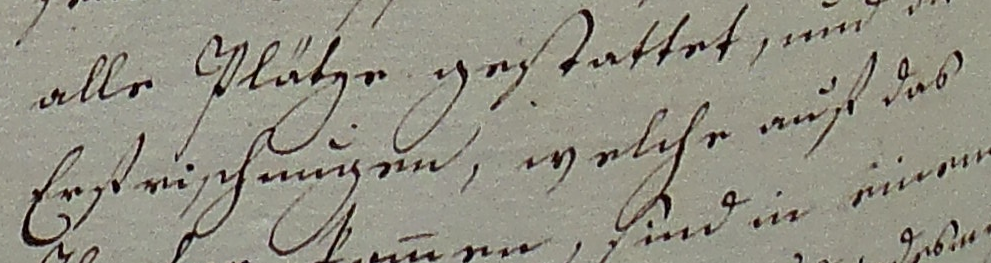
Efrischungen, welche auf das
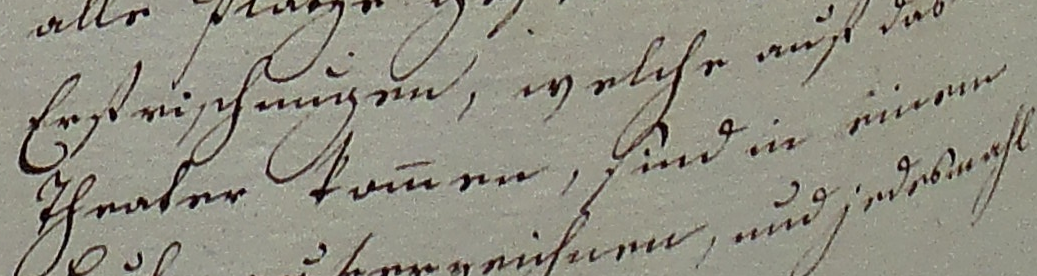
Theater kom̅en, sind in einem
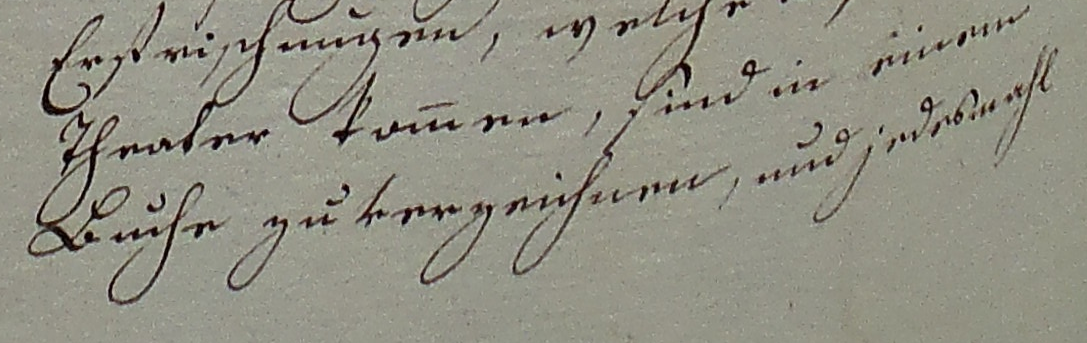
Buche zu verzeichmen, und jedesmahl
